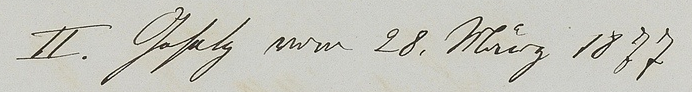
II. Gesetz vom 28. März 1877
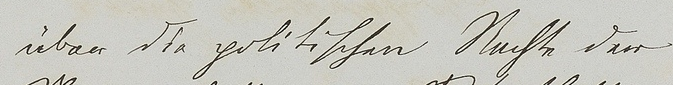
über die politischen Rechte der
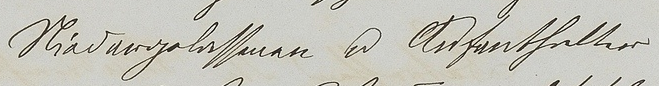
Niedergelassenen u Aufenthalter
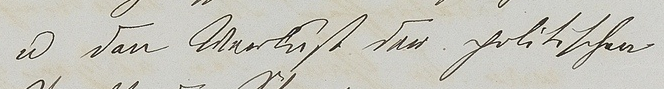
u den Verlust der politischen
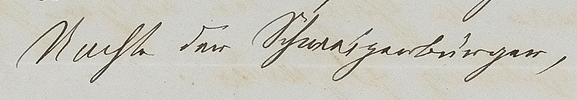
Rechte der Schweizerbürger,
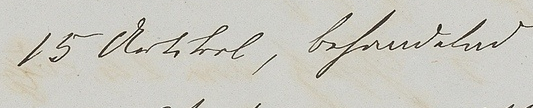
15 Artikel, behandelnd
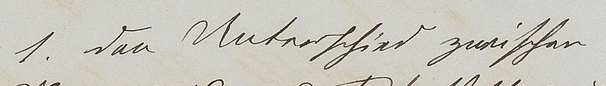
1. den Unterschied zwischen
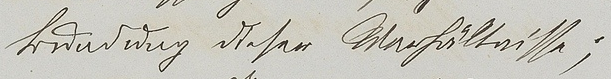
kundung dieser Verhältnisse;
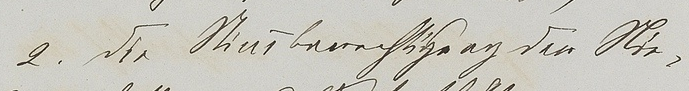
2. Die Stimmberechtigung der Nie-
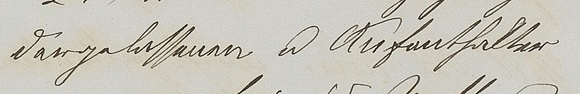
dergelassenen u Aufenthalter
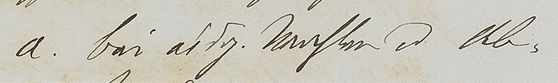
a. bei eidg. Wahlen u Ab-
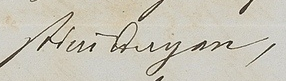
stimmungen,
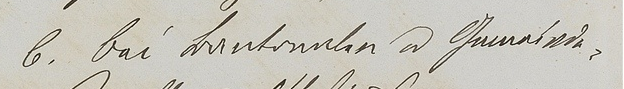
b. bei kantonalen u Gemeinde-
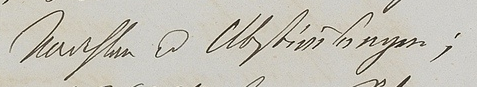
Wahlen u Abstimmungen;
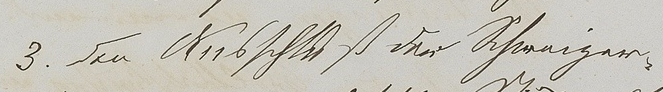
3. Den Ausschluß der Schweizer-
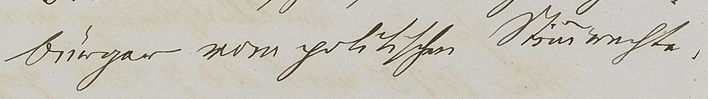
bürger vom politischen Stimmrechte.
